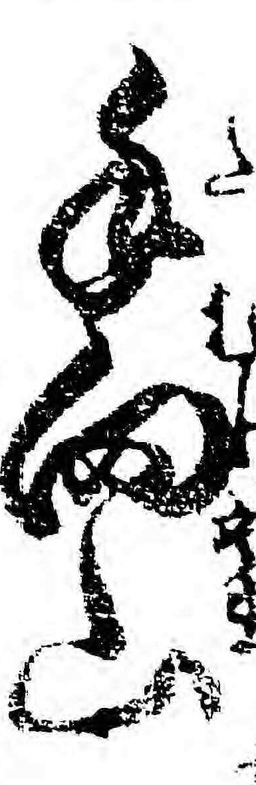手向山
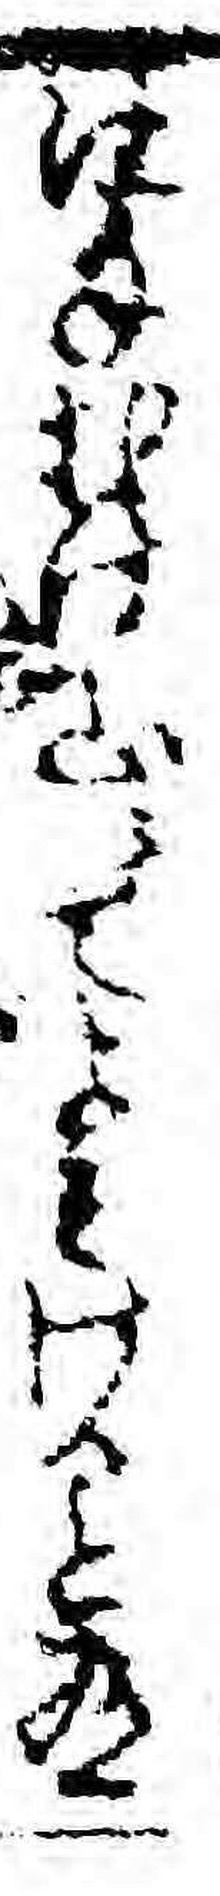に手むけ山にてよみけると有
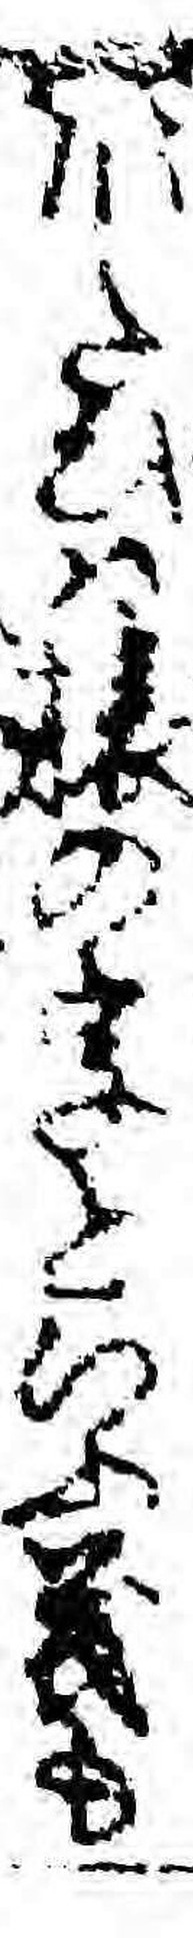此たびは旅の字といふ義も
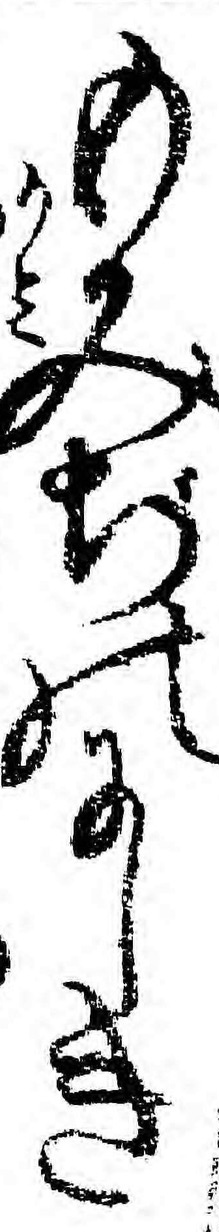もみぢのにしき
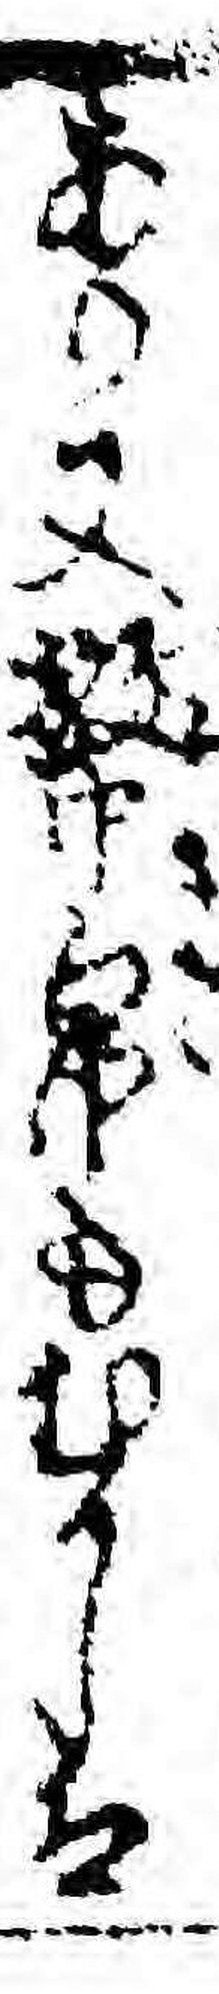あり又幣帛もむかしは
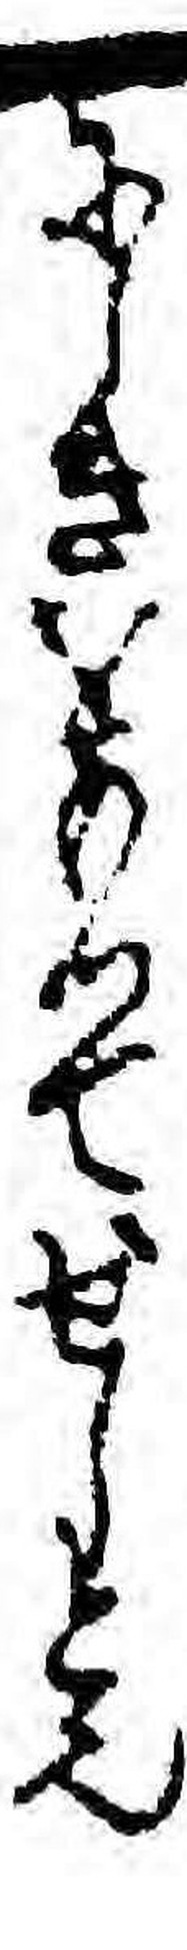にしきをもつてせしと也
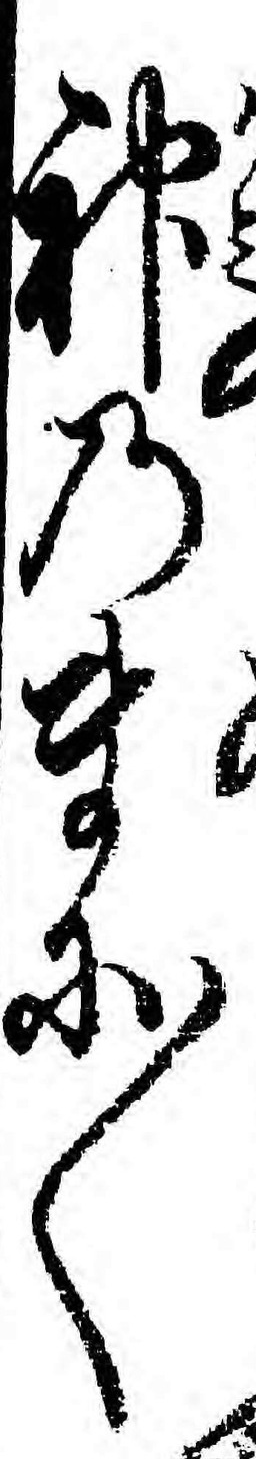神のまに〳〵
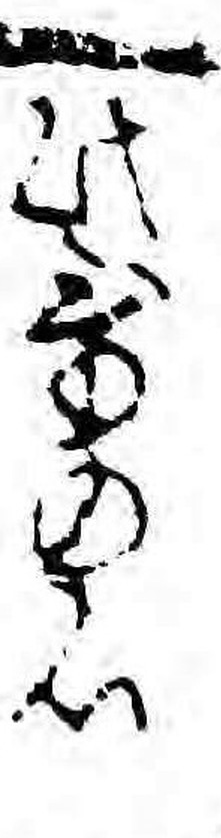此哥の心
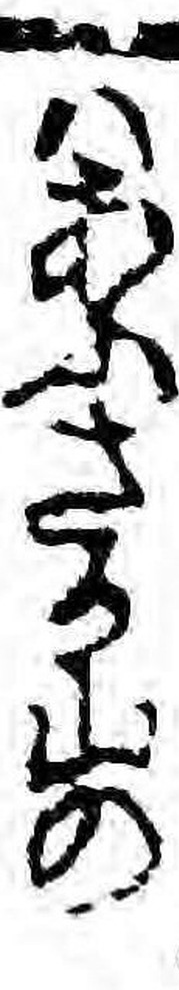はあふさか山の
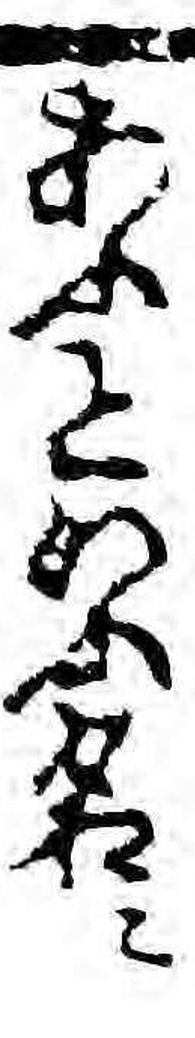あふといふ名に
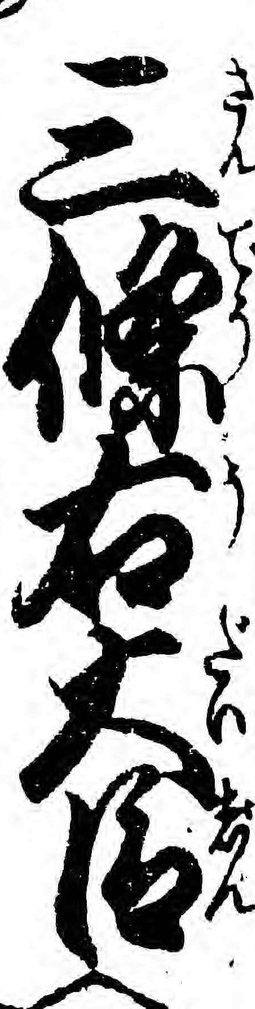三條右大臣
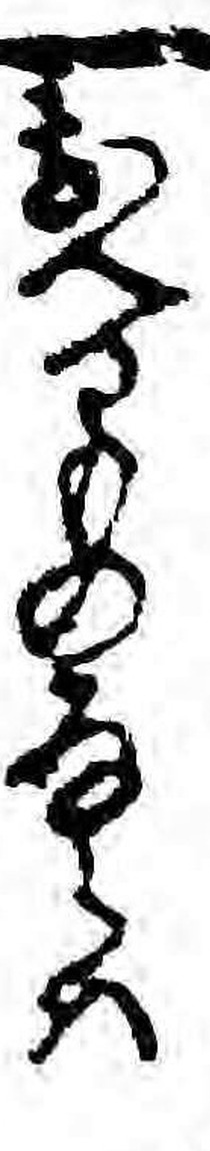おへるものならは
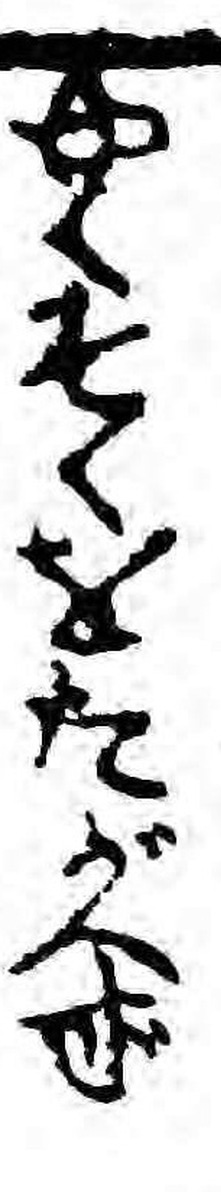やくそくをたかへず
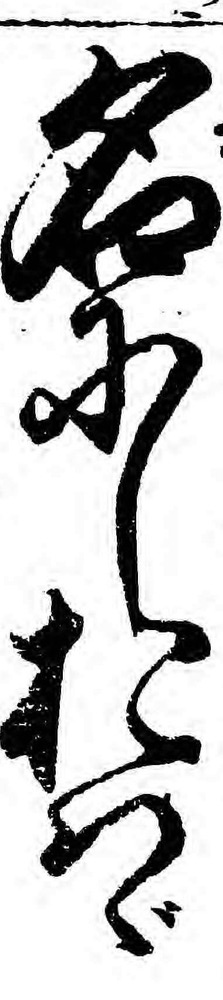名にしおはゞ
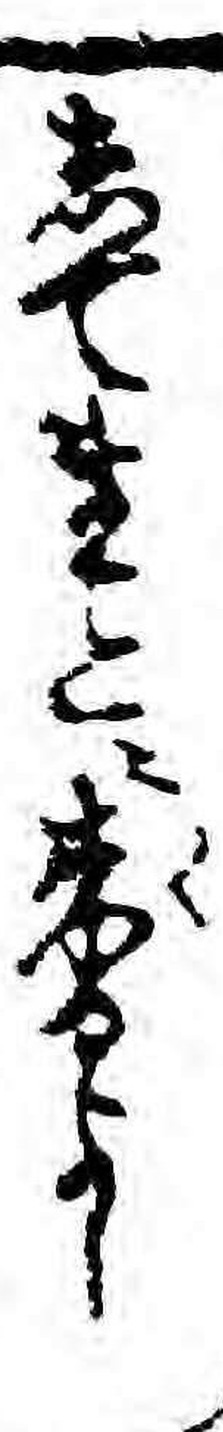してまことに来るよし
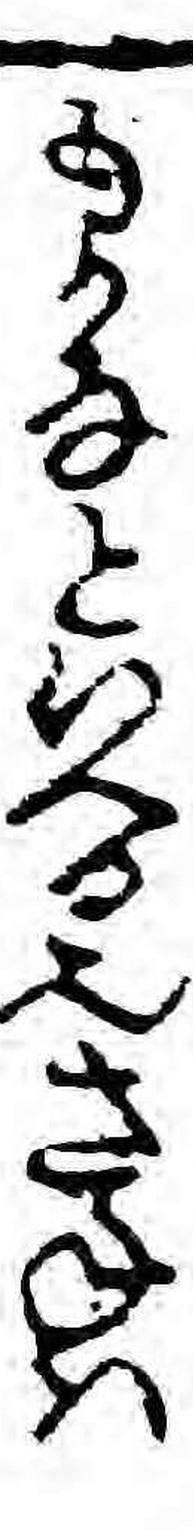もかなといへる也さねは
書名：頭書和歌注譯／壽賀多百人一首小倉錦
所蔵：国文学研究資料館
